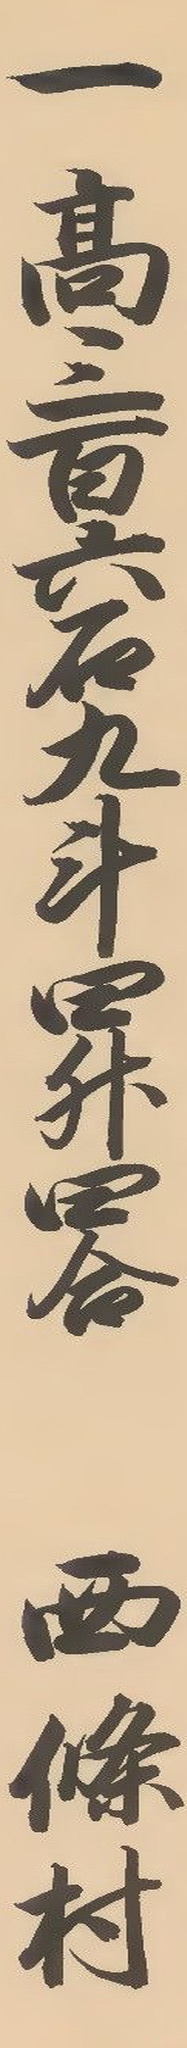一高三百六石九斗四升四合西条村
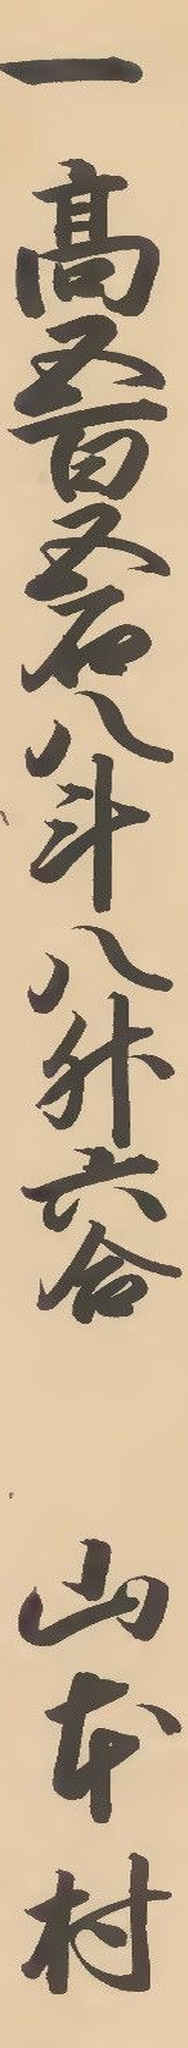一高五百五石八斗八升六合山本村
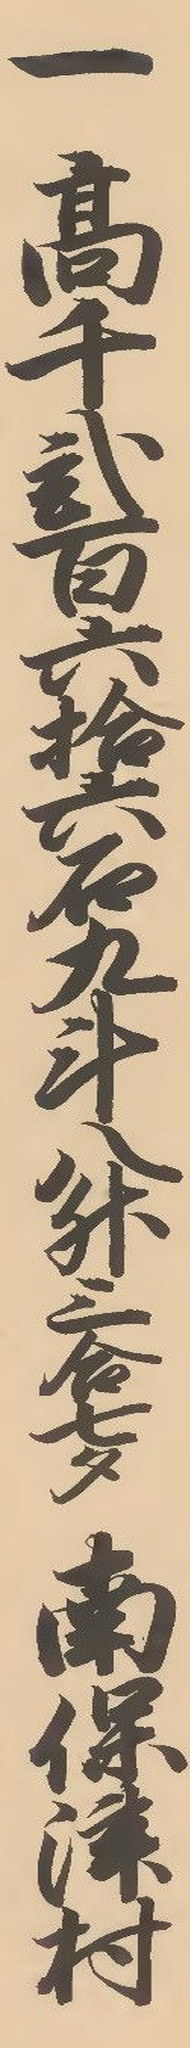一高千弐百六拾六石九斗八升三合七勺南保津村

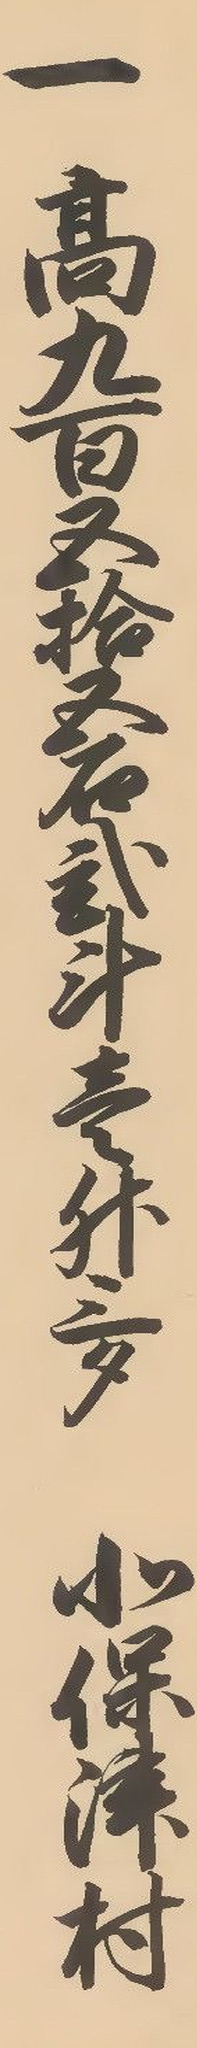一高九百五拾五石弐斗壱升三勺北保津村
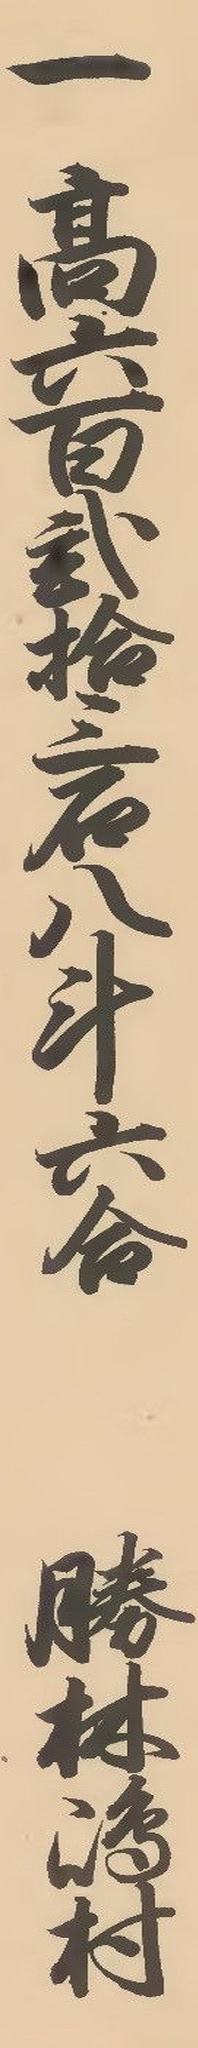一高六百弐拾三石八斗六合勝林島村
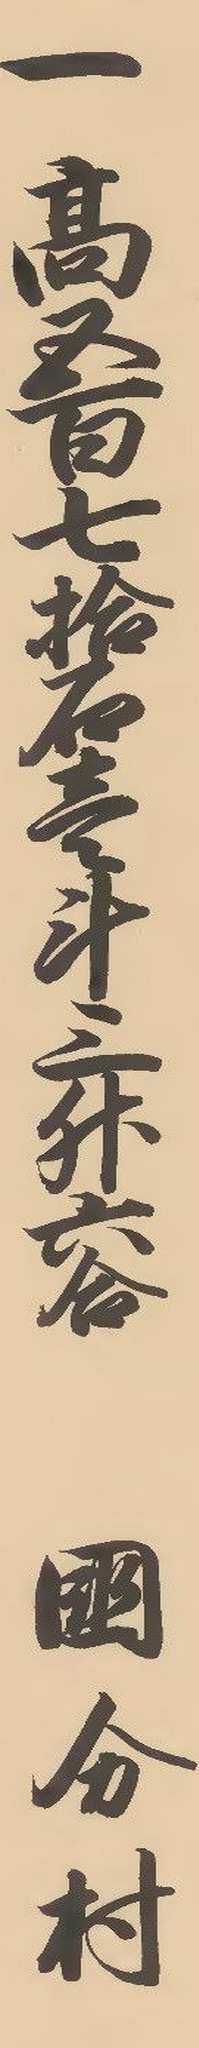一高五百七拾石壱斗三升六合国分村
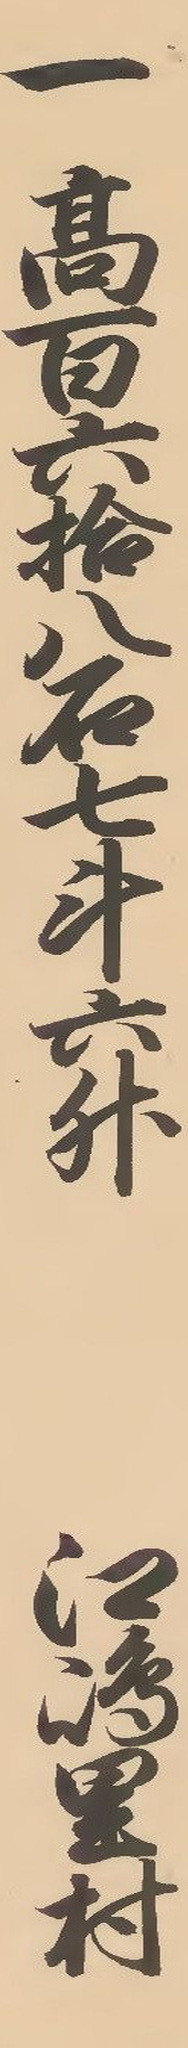一高百六拾八石七斗六升江島里村
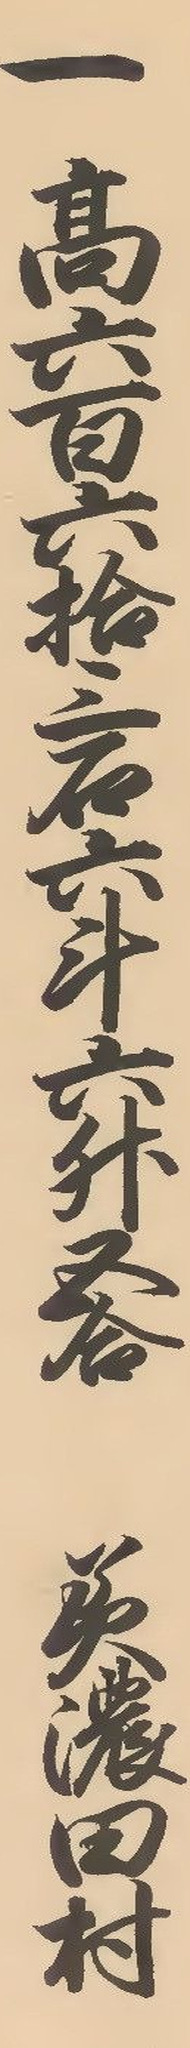一高六百六拾三石六斗六升五合美濃田村
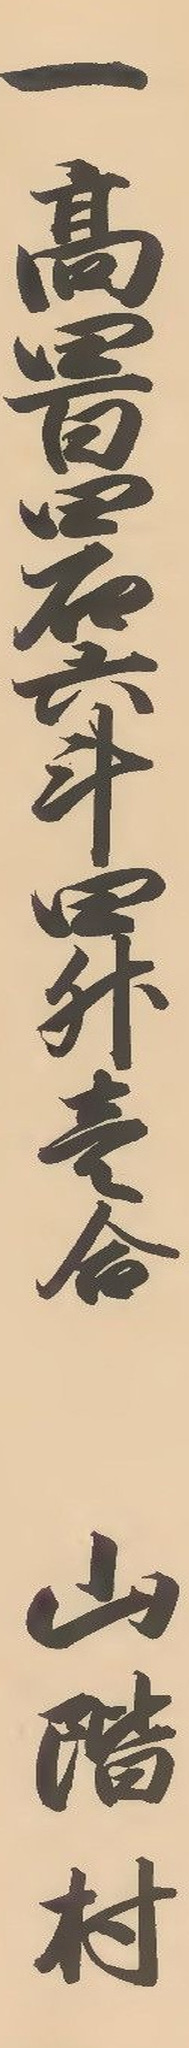一高四百四石六斗四升壱合山階村
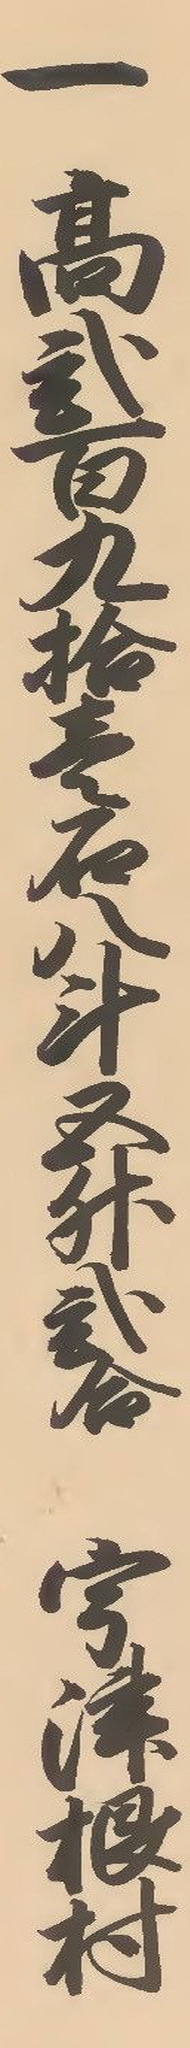一高弐百九拾壱石八斗五升弐合宇津根村

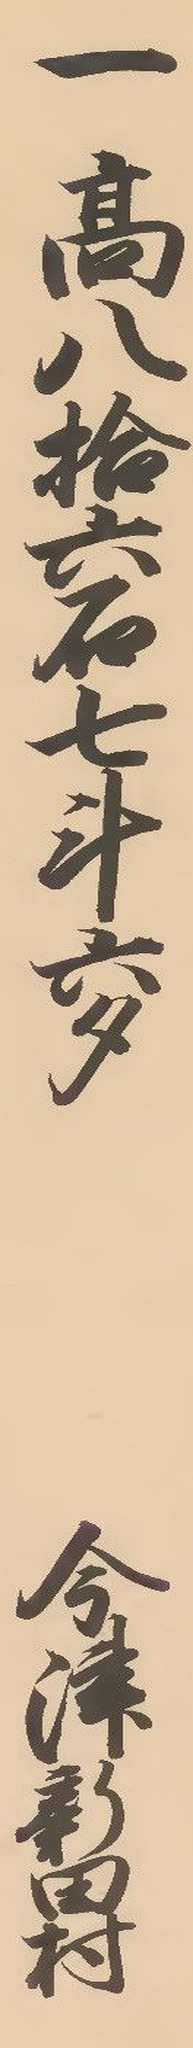一高八拾六石七斗六勺今津新田村
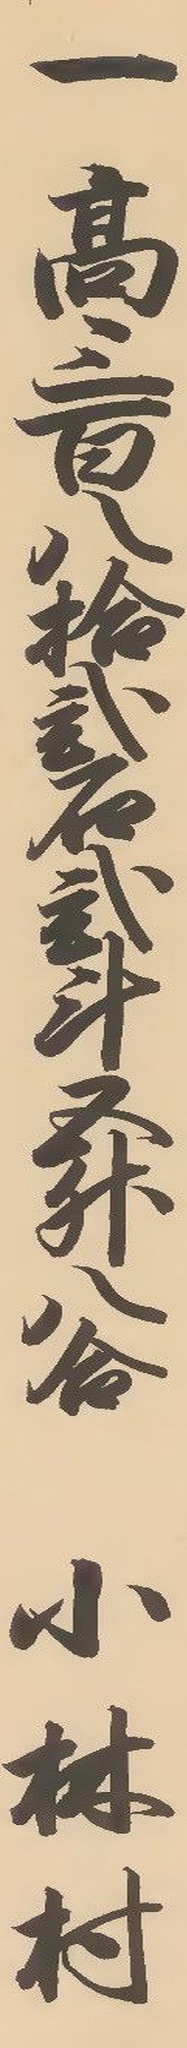一高三百八拾弐石弐斗五升八合小林村
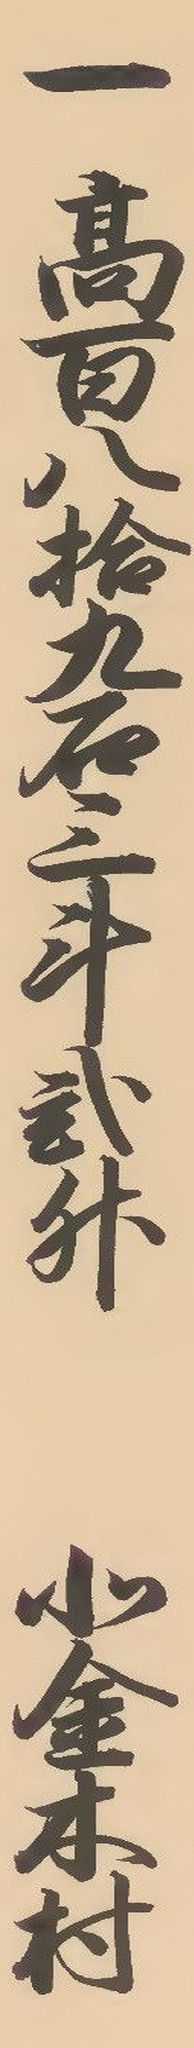一高百八拾九石三斗弐升北金木村
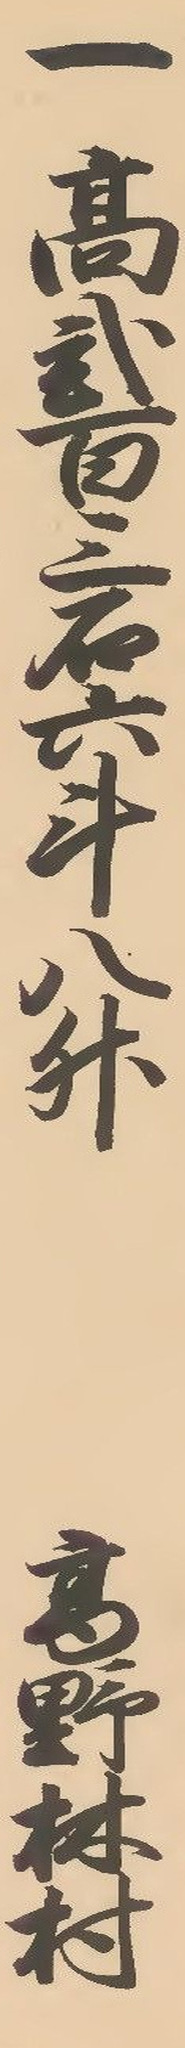一高弐百三石六斗八升高野林村
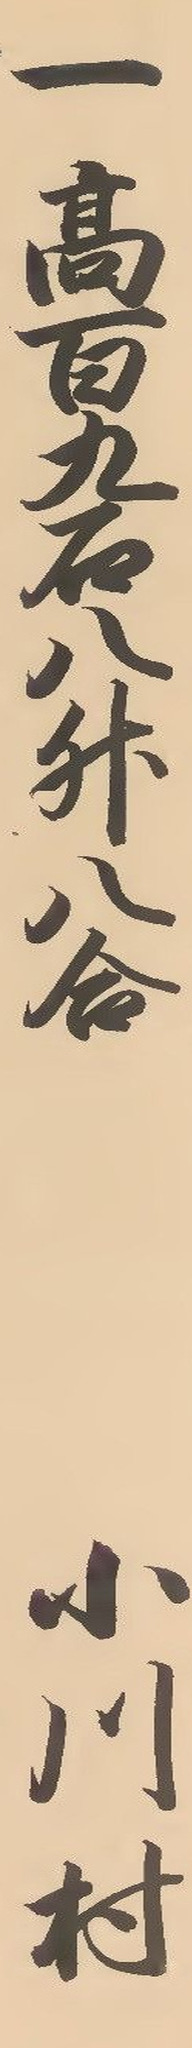一高百九石八升八合小川村
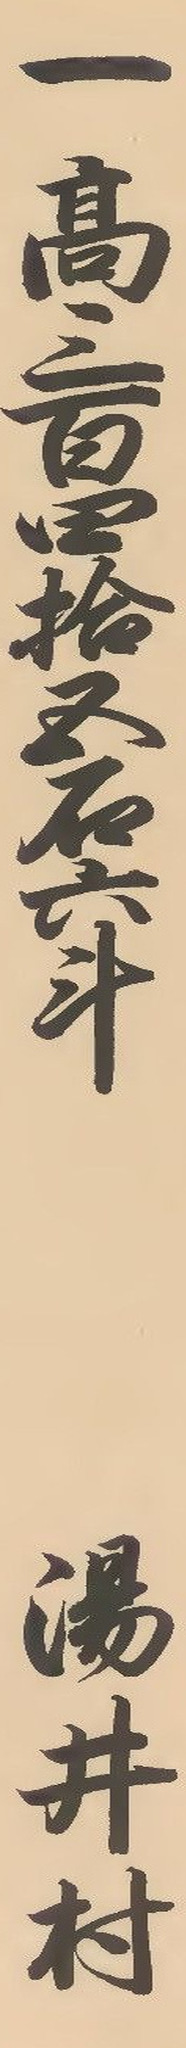一高三百四拾五石六斗湯井村
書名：丹波国郷帳
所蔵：国立公文書館 National Archives of Japan
